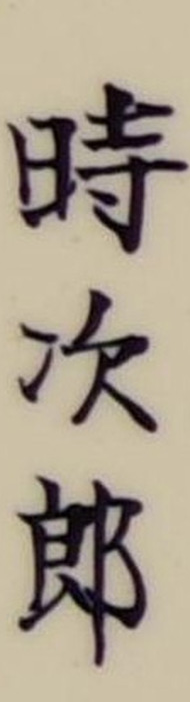時次郎
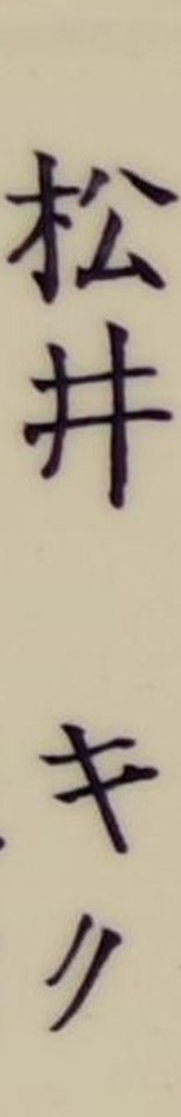松井キク

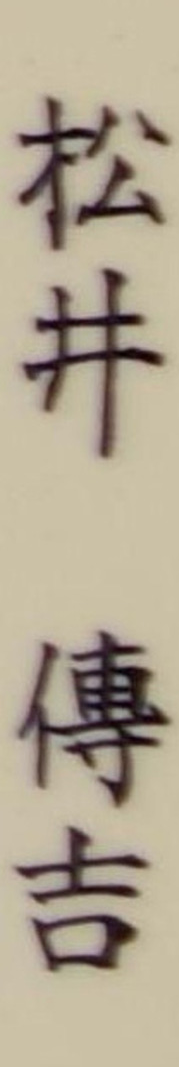松井傳吉
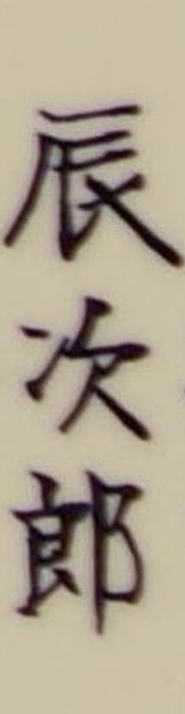辰次郎
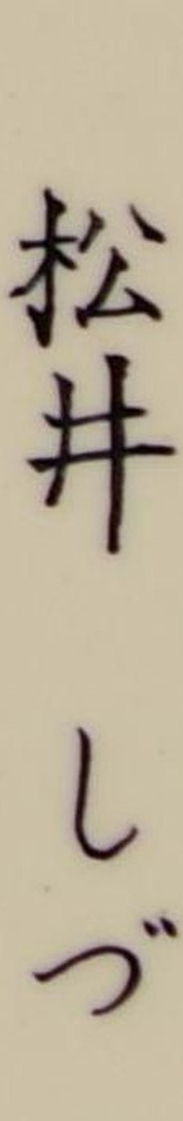松井しづ
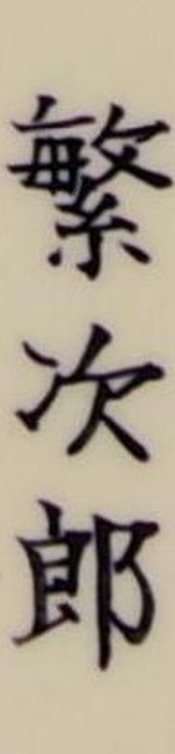繁次郎
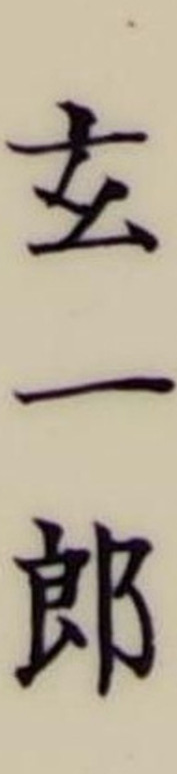玄一郎
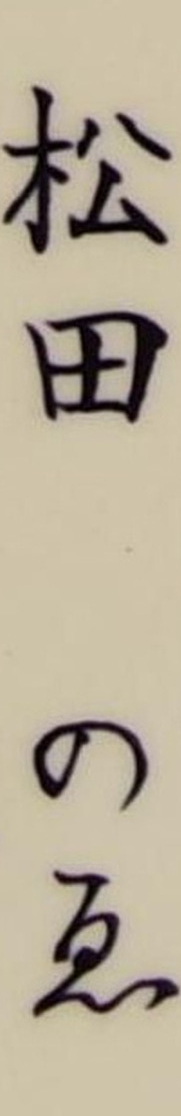松田のゑ
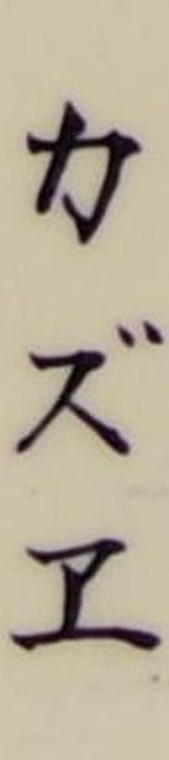カズヱ
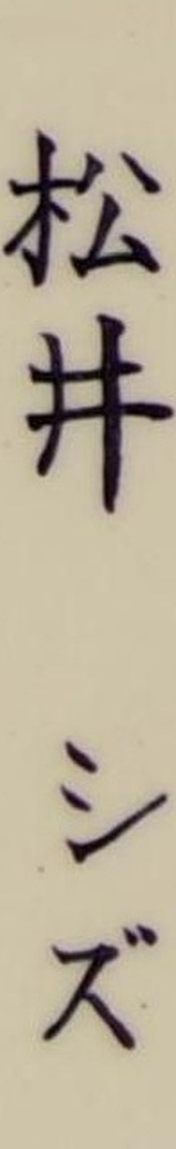松井シズ
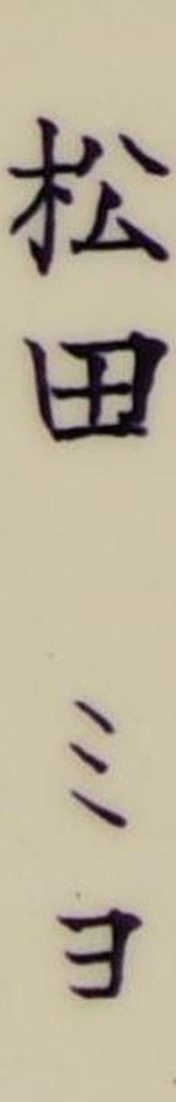松田ミヨ
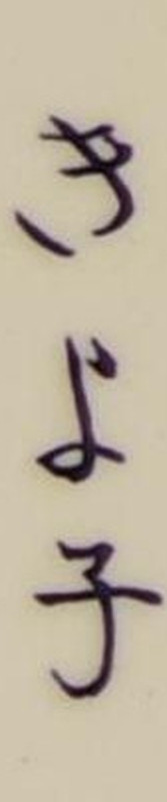きよ子

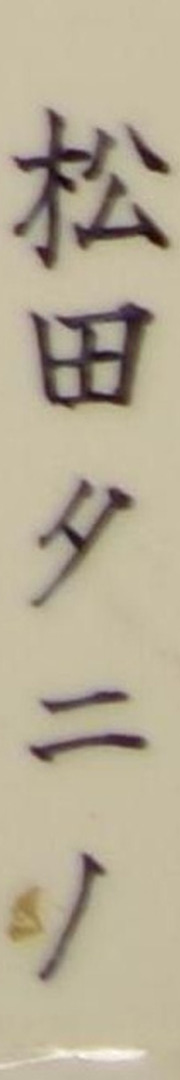松田タ二ノ
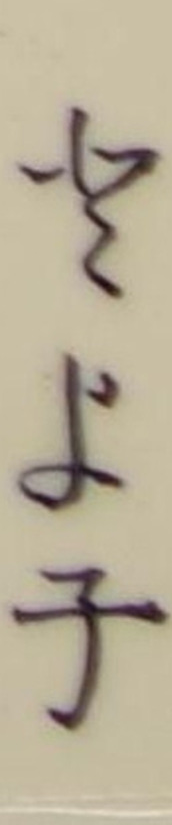とよ子
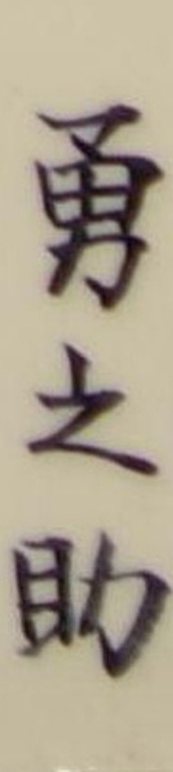勇之助
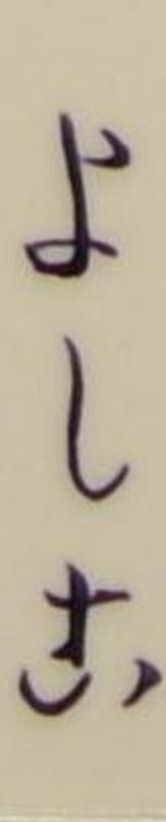よしこ
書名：A~D
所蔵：koyasan kongobuji
